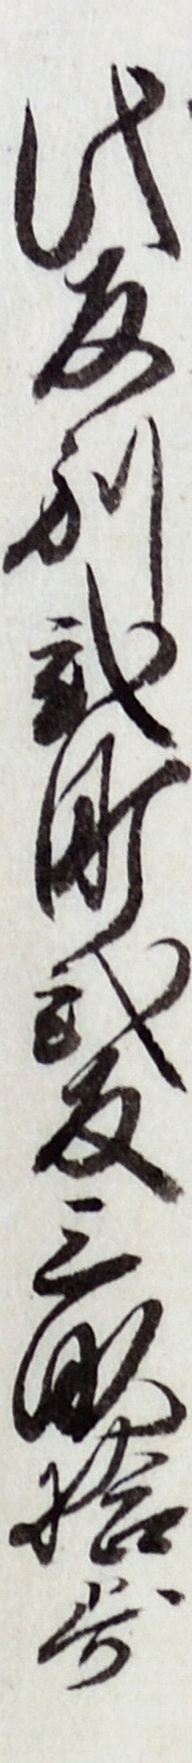此反別弐町弐反三畝拾歩
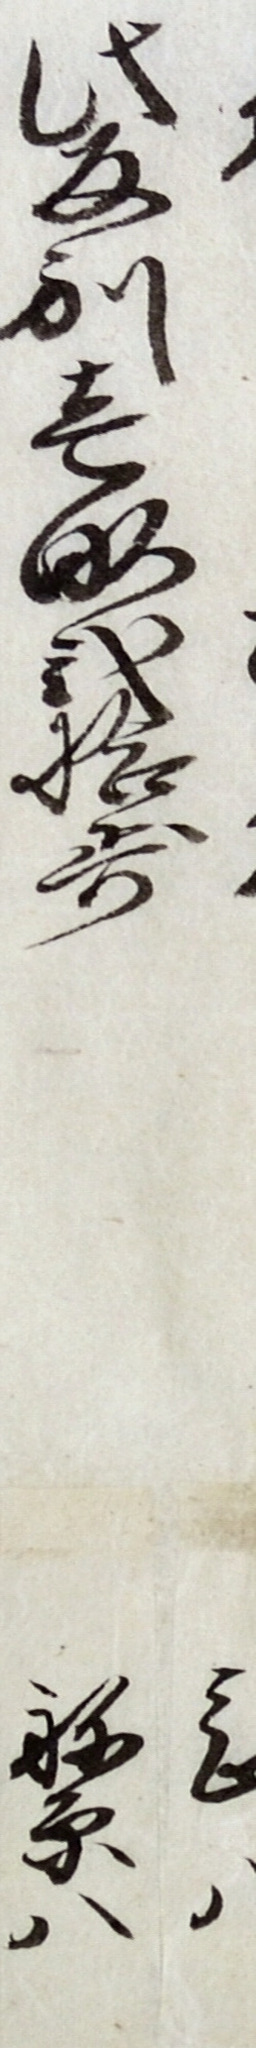此反別壱畝弐拾歩祢原八
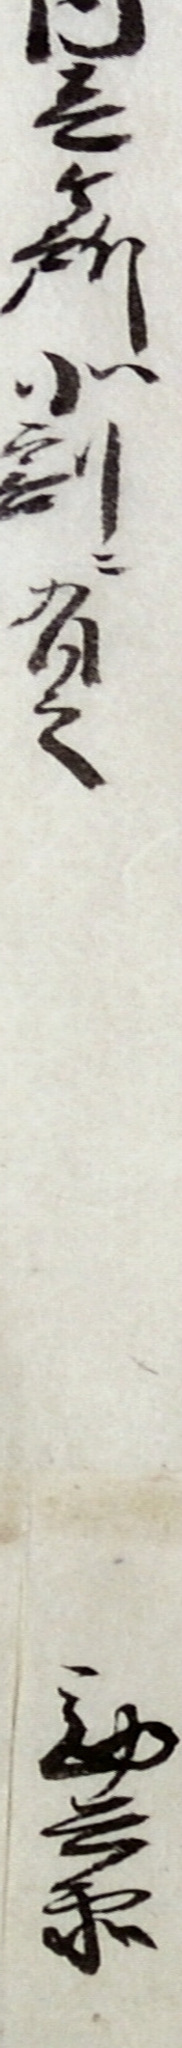内壱ヶ所北割ニ有之勘兵衛
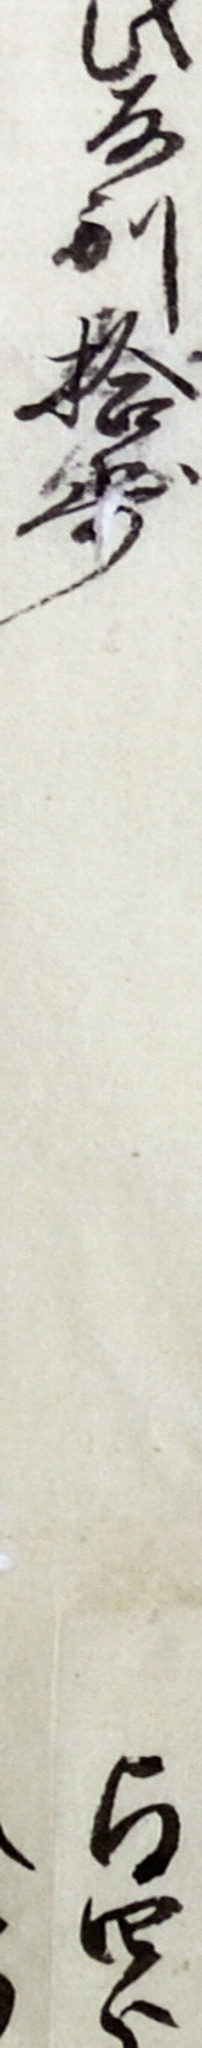此反別拾歩与四郎

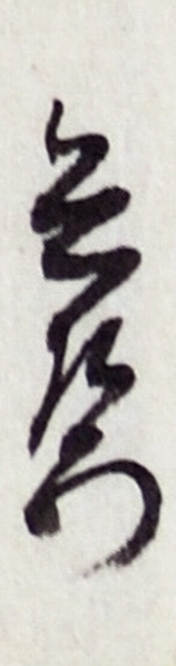嘉左衛門
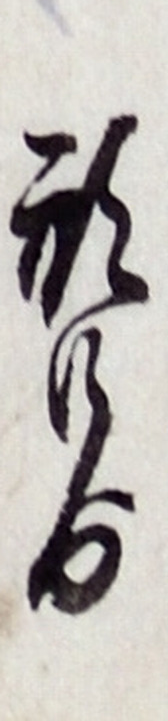嘉左衛門
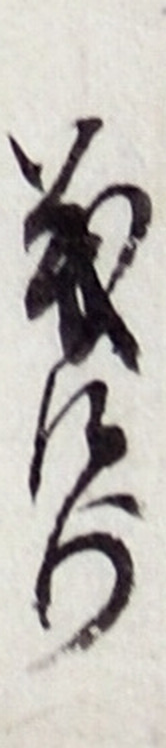嘉左衛門
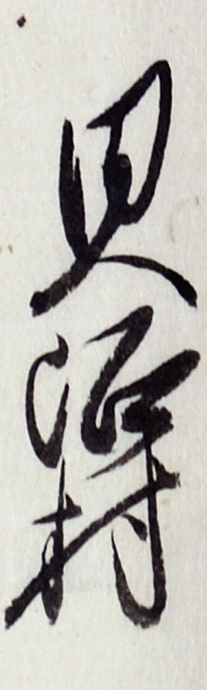貝沼村
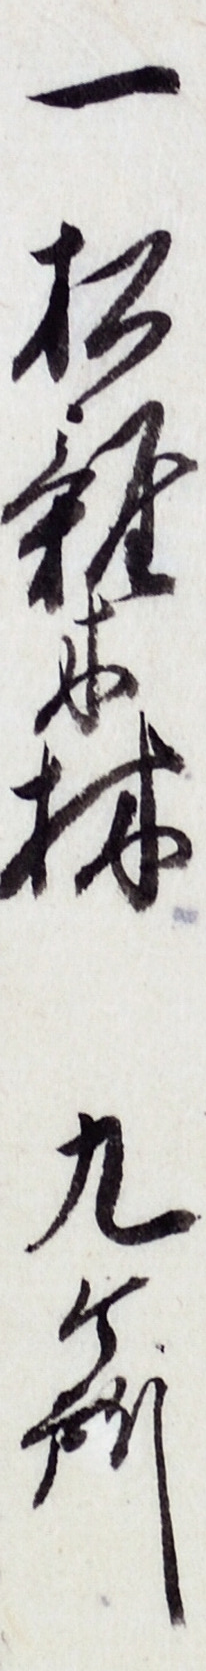一松雑木林九ケ所
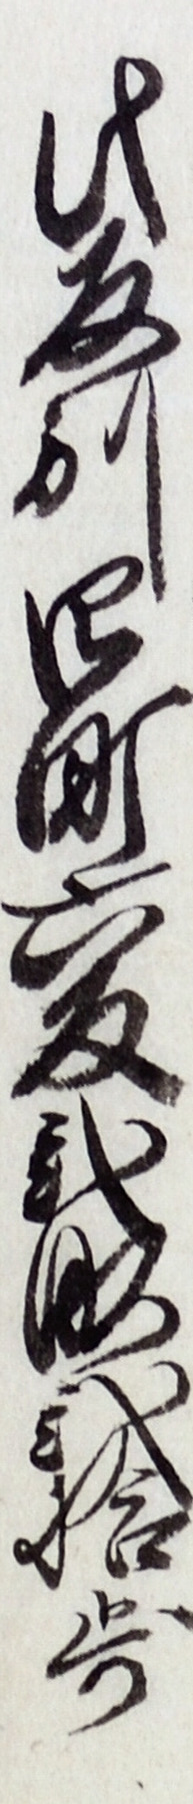此反別四町六反弐畝弐拾歩
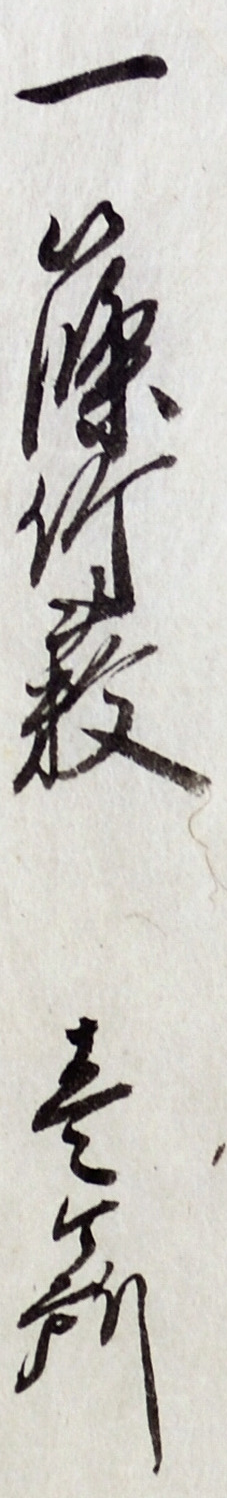一篠竹藪壱ケ所
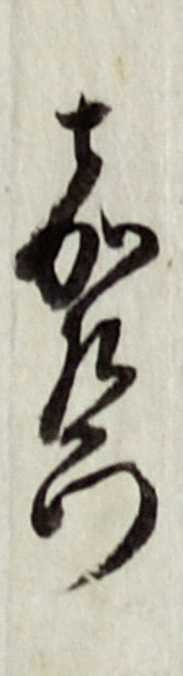嘉左衛門

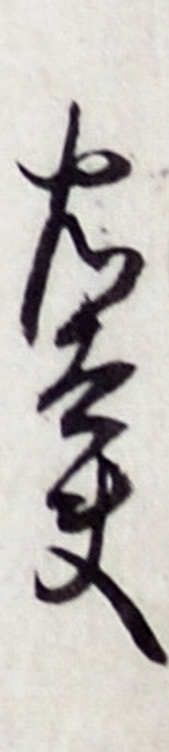忠太夫
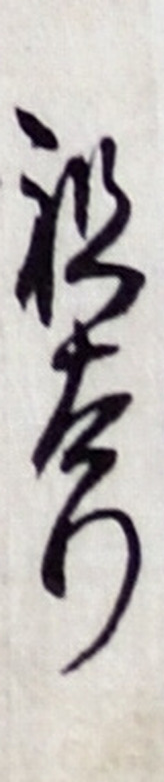安右衛門
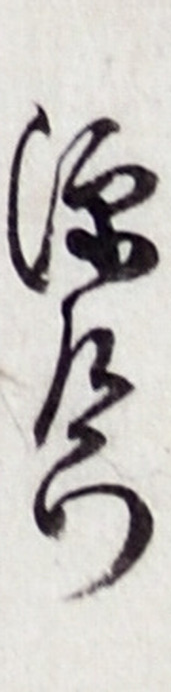源左衛門
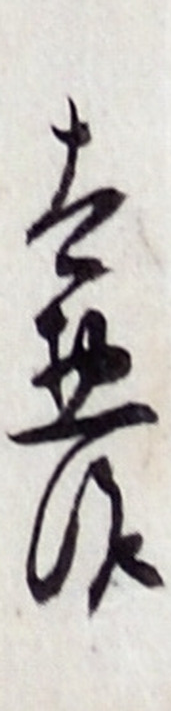太惣治
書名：御領分中御林御藪附帳
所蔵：伊那市立高遠町図書館・合同会社AMANE
